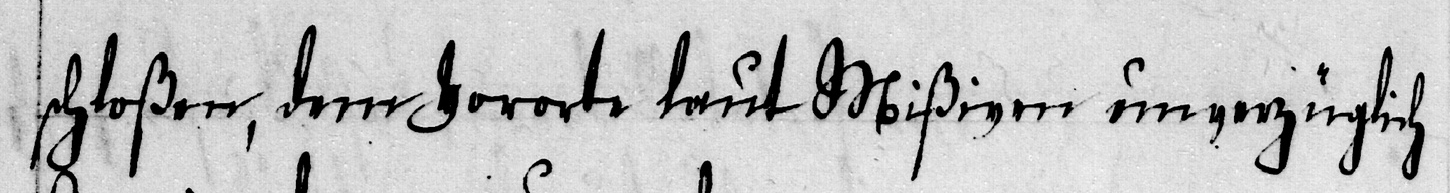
schloßen, dem Vororte laut Mißiven unverzüglich
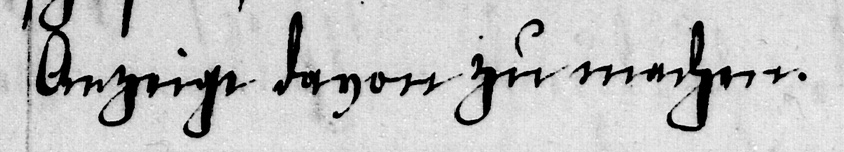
Anzeige davon zu machen.
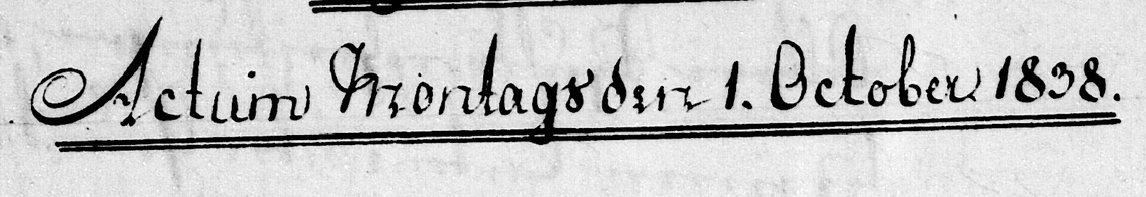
Actum Montags den 1. October 1838.]
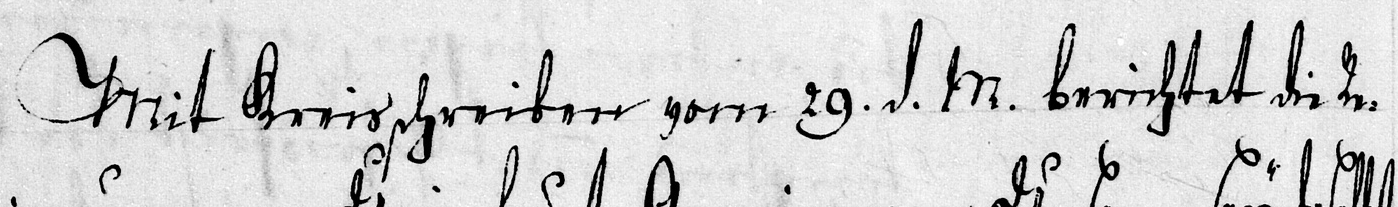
Mit Kreisschreiben vom 29. d. M. berichtet die Re¬
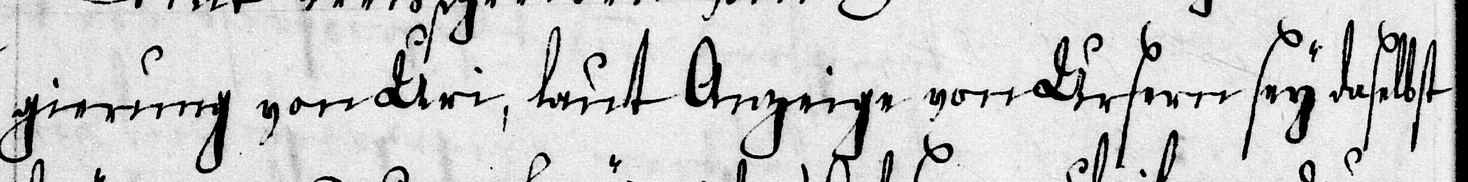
gierung von Uri, laut Anzeige von Ursern sey daselbst
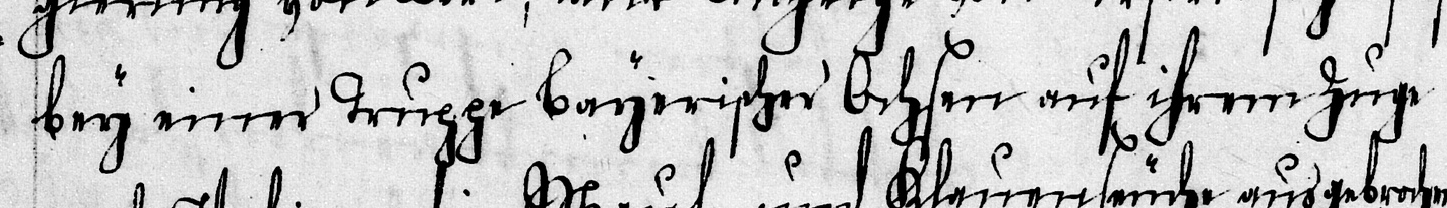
bey einer Truppe Bayerischer Ochsen auf ihrem Zuge
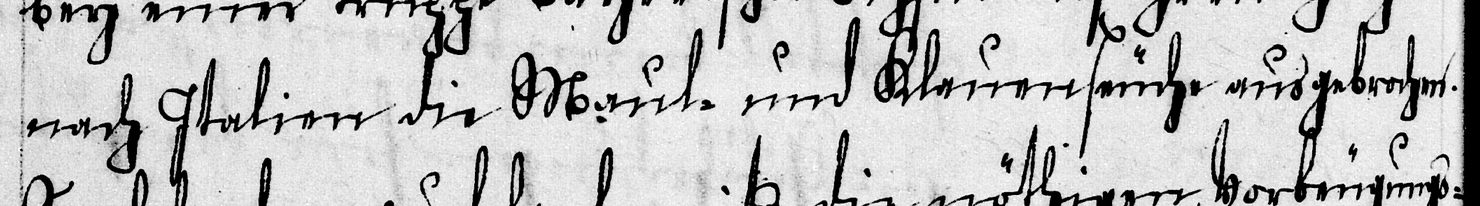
nach Italien die Maul- und Klauenseuche ausgebrochen.
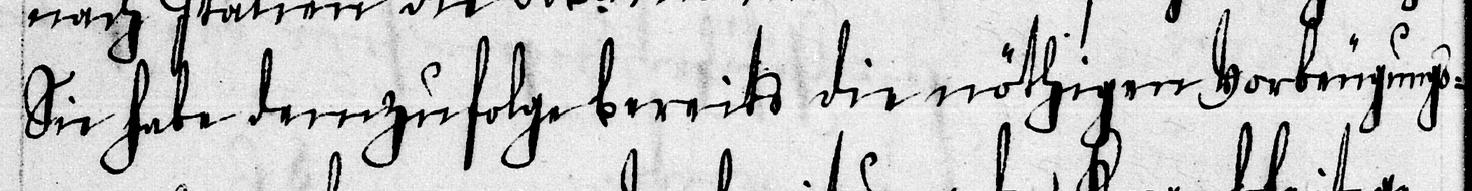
Sie habe demzufolge bereits die nöthigen Vorbeugung¬
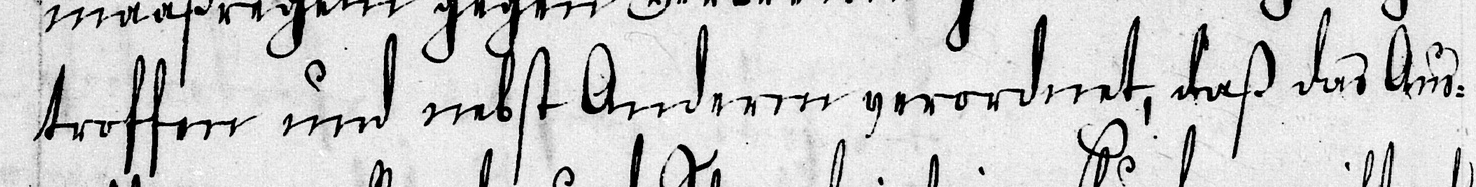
troffen und nebst Anderm verordnet, daß das Aus¬
